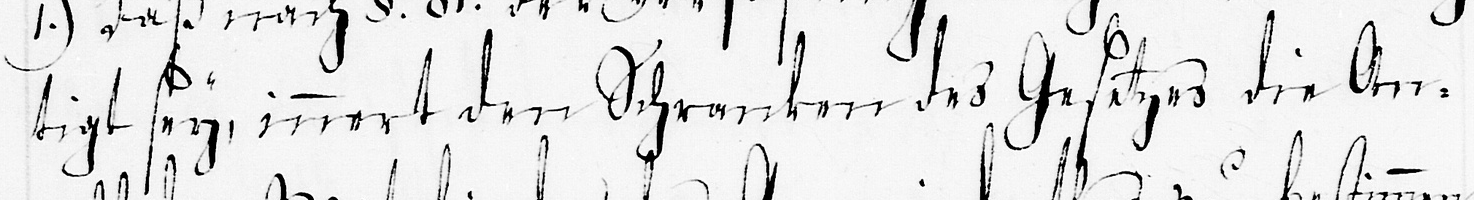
tigt sey, innert den Schranken des Gesetzes die An¬
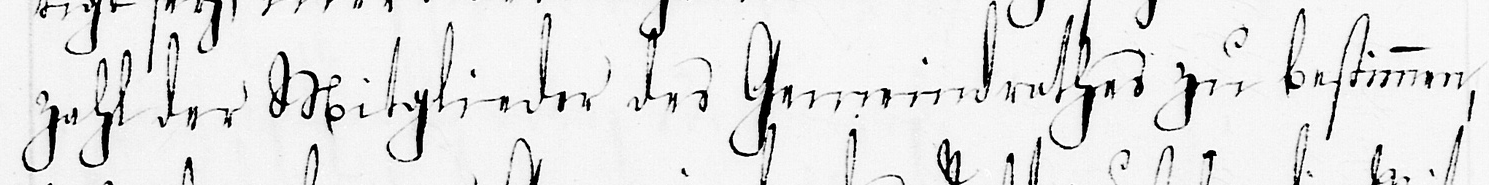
zahl der Mitglieder des Gemeindrathes zu bestimmen,
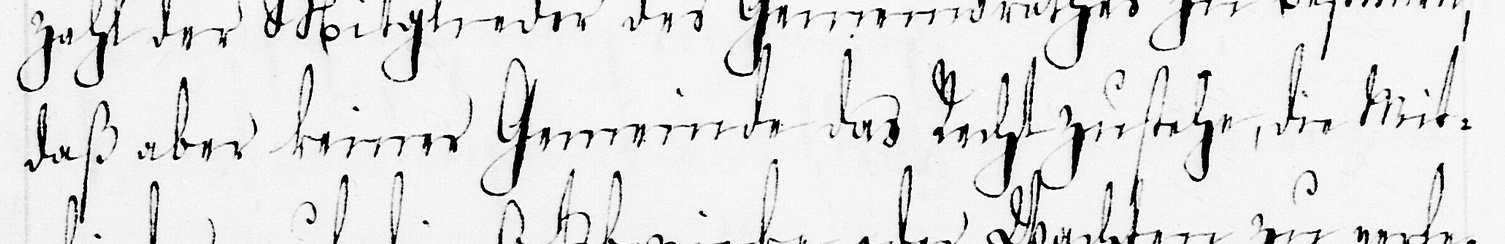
daß aber keiner Gemeinde das Recht zustehe, die Mit¬
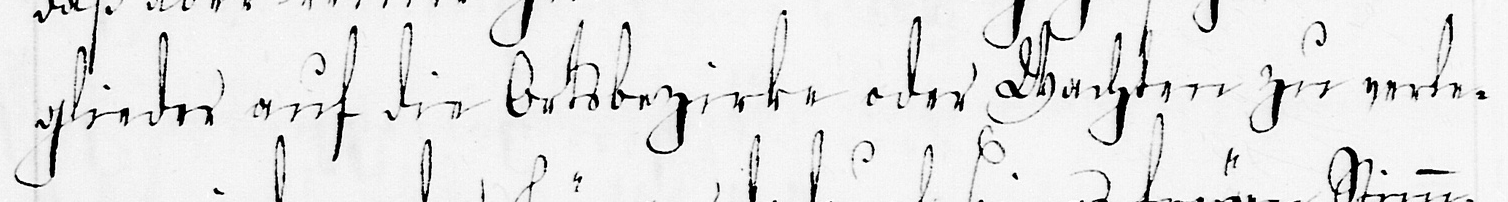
glieder auf die Ortsbezirke oder Wachten zu verle¬
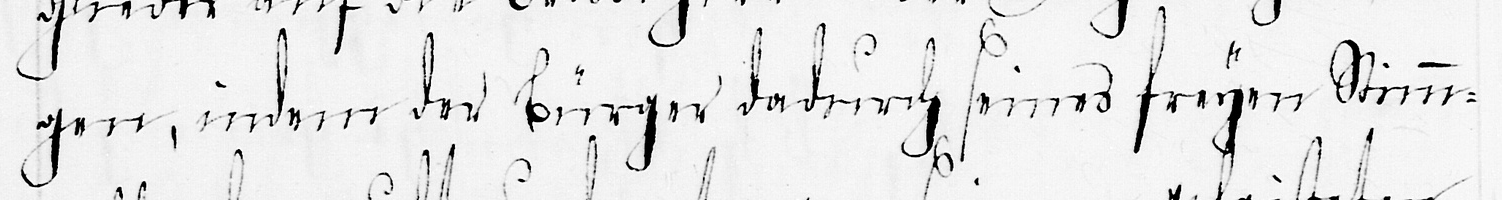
gen, indem der Bürger dadurch seines freyen Stimm¬
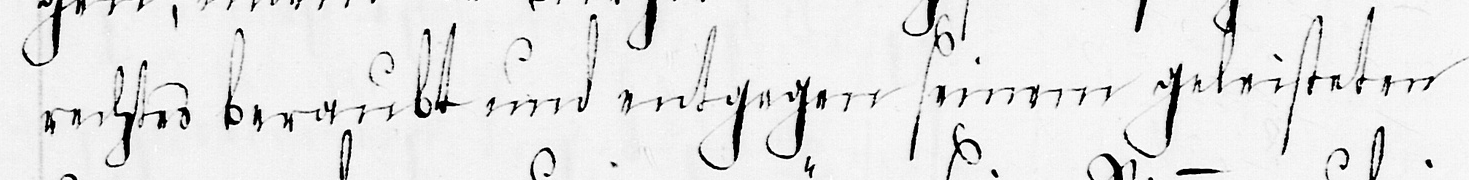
rechtes beraubt und entgegen seinem geleisteten
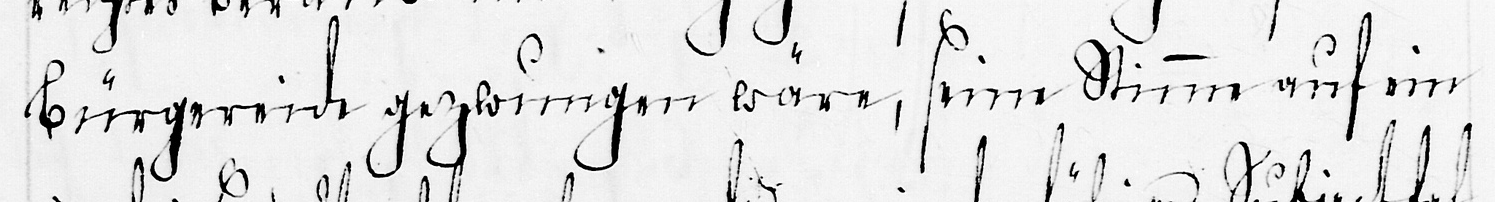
Bürgereide gezwungen wäre, seine Stimme auf ein
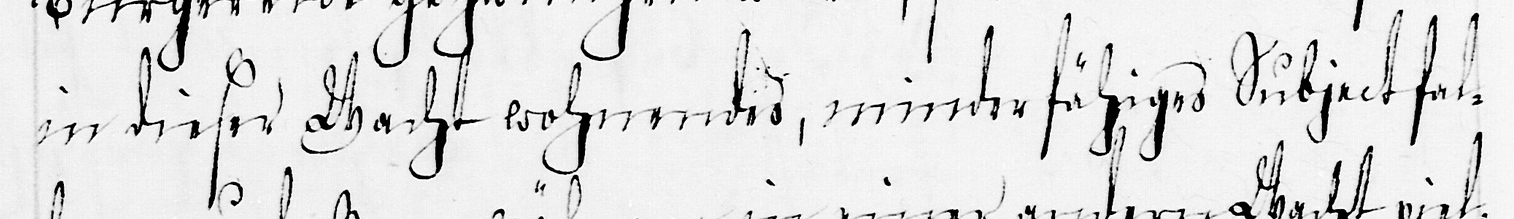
in dieser Wacht wohnendes, minderfähiges Subject fal¬
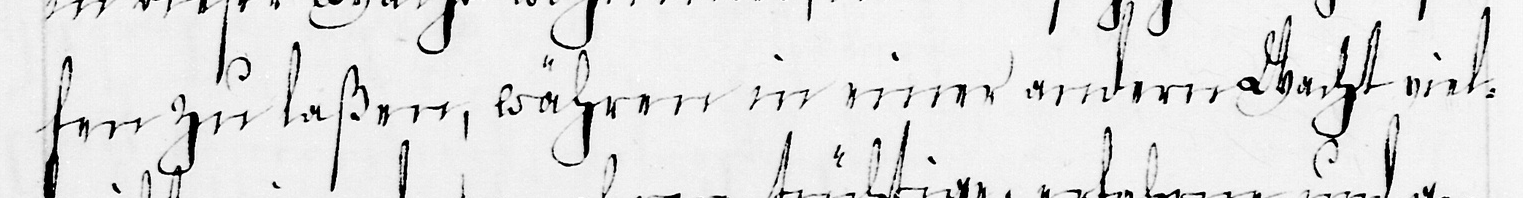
len zu laßen, währen[d] in einer andern Wacht viel¬
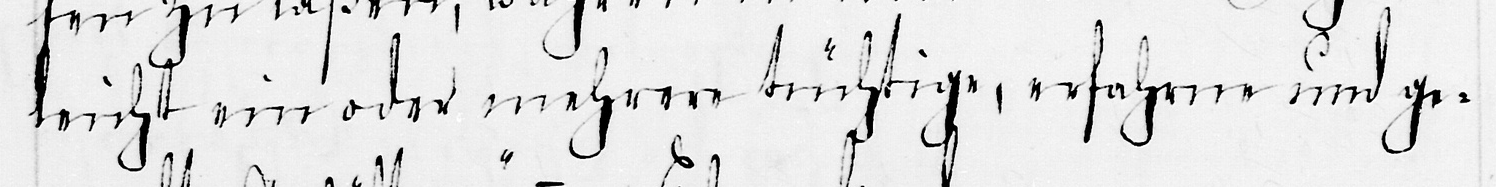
leicht ein oder mehrere tüchtige, erfahrene und ge¬
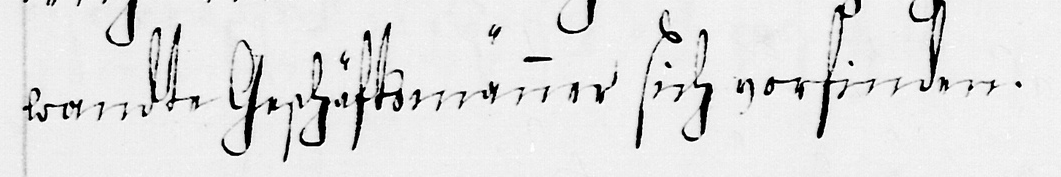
wandte Geschäftsmänner sich vorfinden.
